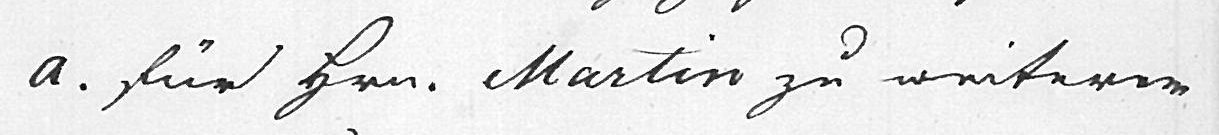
a. für Hrn. Martin zu weiterer
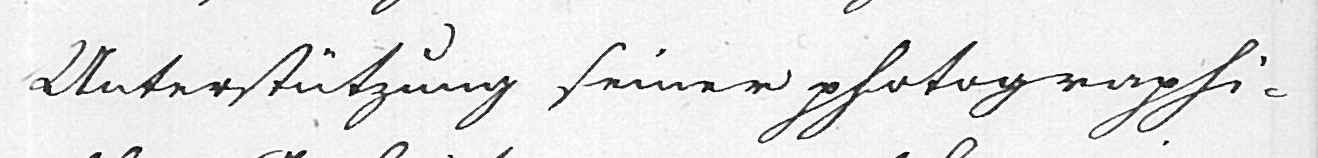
Unterstützung seiner photographi-
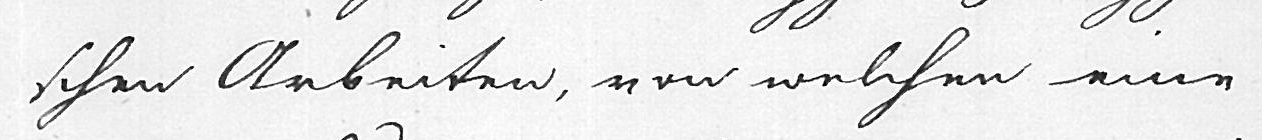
schen Arbeiten, von welchen eine
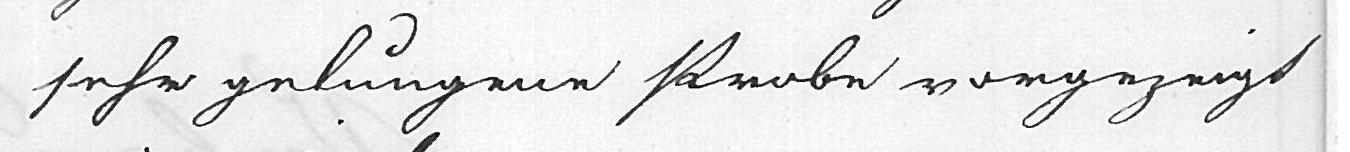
sehr gelungene Probe vorgezeigt
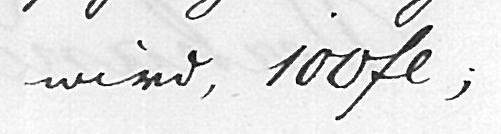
wird, 100 fl;
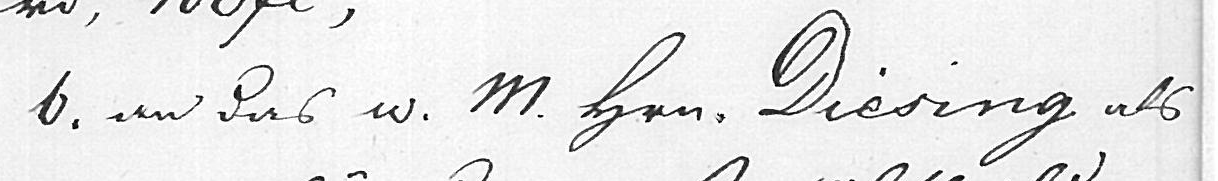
b. an das w. M. Hrn. Diesing als
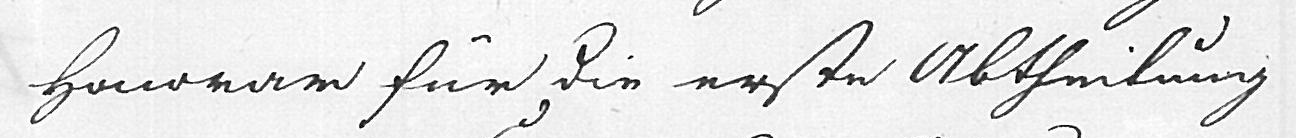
Honorar für die ersten Abtheilung
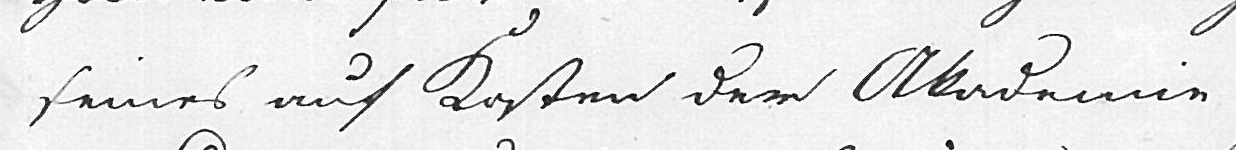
seines auf Kosten der Akademie
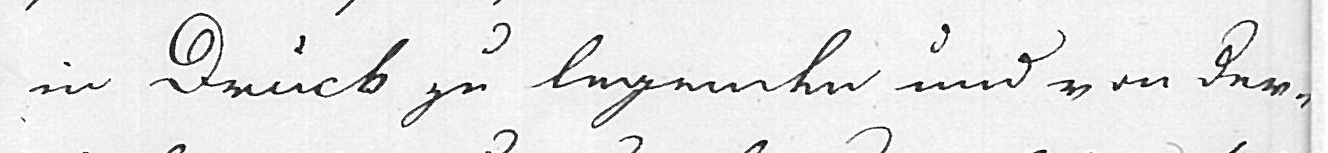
in Dank zu legenden und von der-
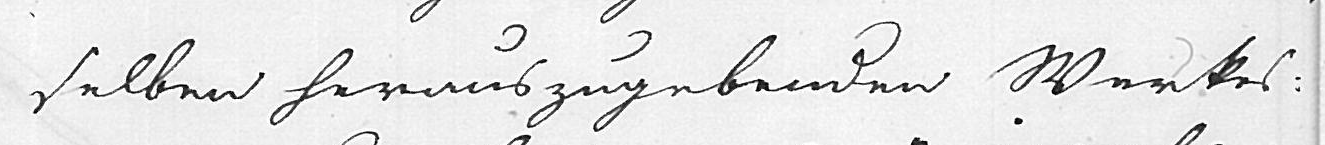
selben herauszugebenden Werkes:
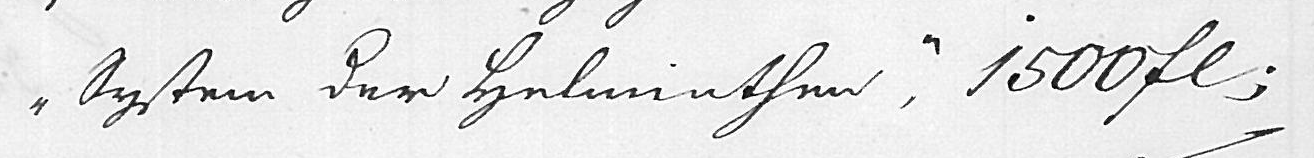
"System der Helminthen", 1500 fl;
